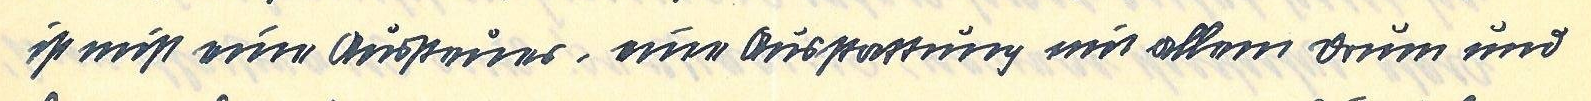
ist nicht eine Aussteuer, eine Ausstattung mit allem Drum und
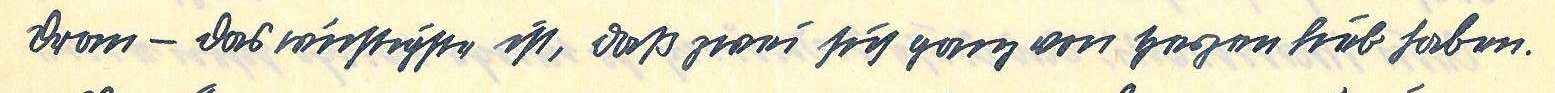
Dran – das wichtigste ist, daß zwei sich ganz von Herzen lieb haben.
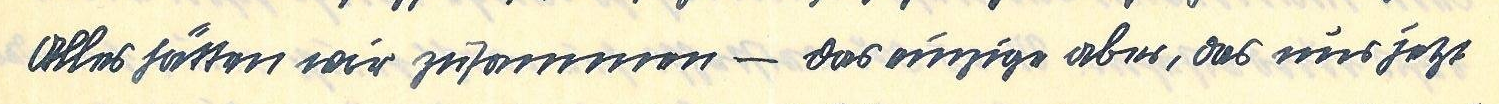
Alles hätten wir zusammen – das einzige aber, das uns jetzt
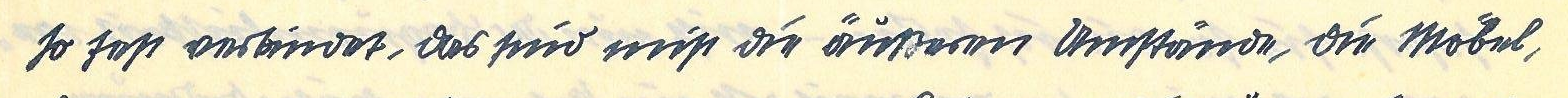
so fest verbindet, das sind nicht die äußeren Umstände, die Möbel,
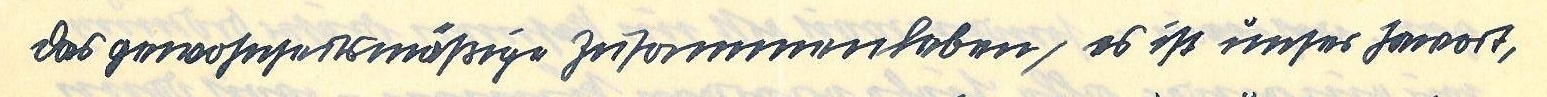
das gewohnheitsmäßige Zusammenleben, es ist unser Jawort,
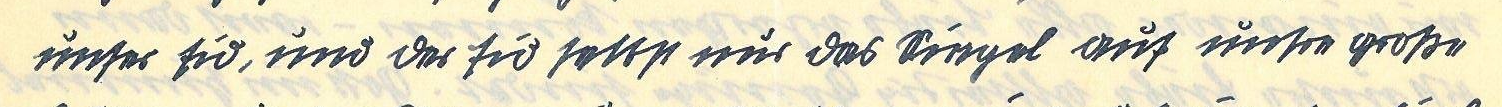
unser Eid, und der Eid selbst nur das Siegel auf unsre große
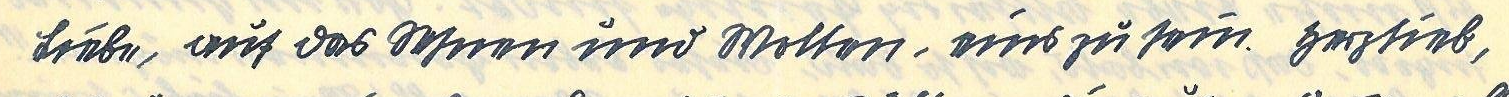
Liebe, auf das Sehnen und Wollen, eins zu sein. Herzlieb,
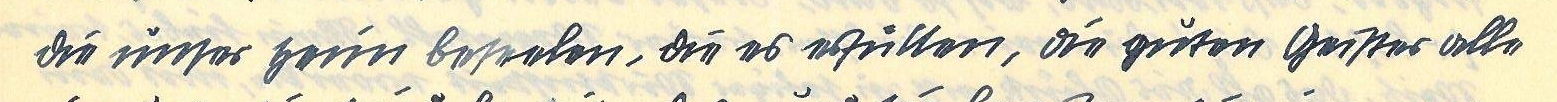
die unser Heim besuchen, die es erfüllen, die guten Geister alle
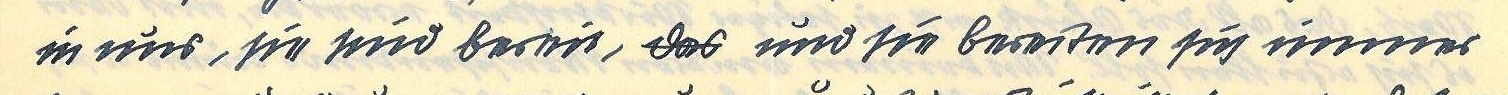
in uns, sie sind bereit, das und sie bereiten sich immer
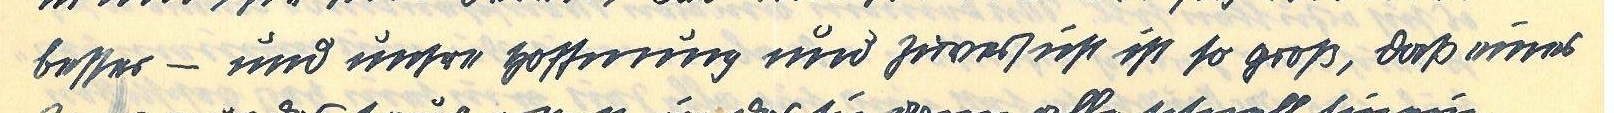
besser – und unsre Hoffnung und Zuversicht ist so groß, daß eines
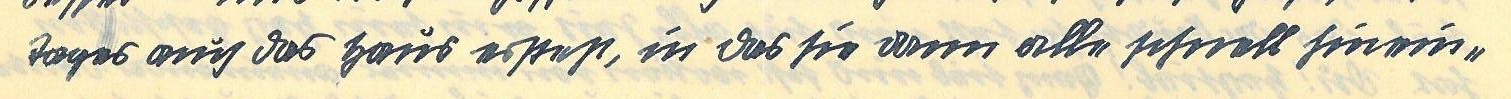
Tages auch das Haus ersteht, in das sie dann alle schnell hinein¬
